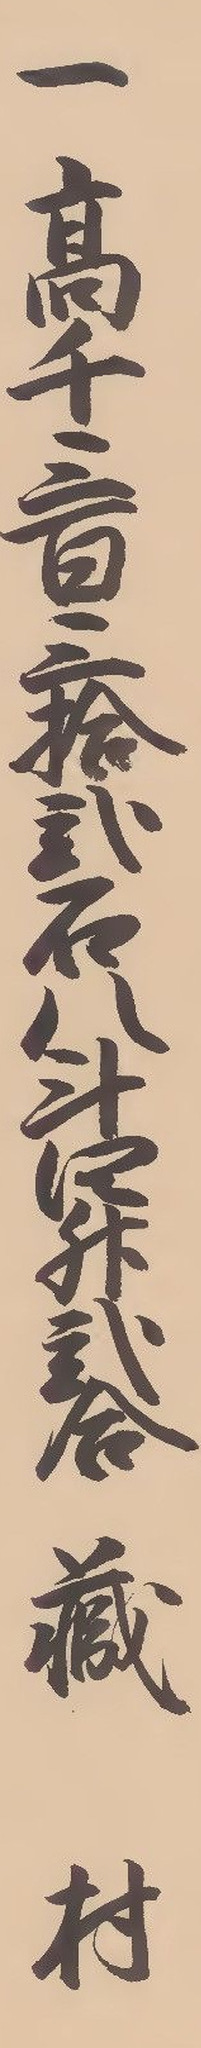一高千三百三拾弐石八斗四升弐合蔵村

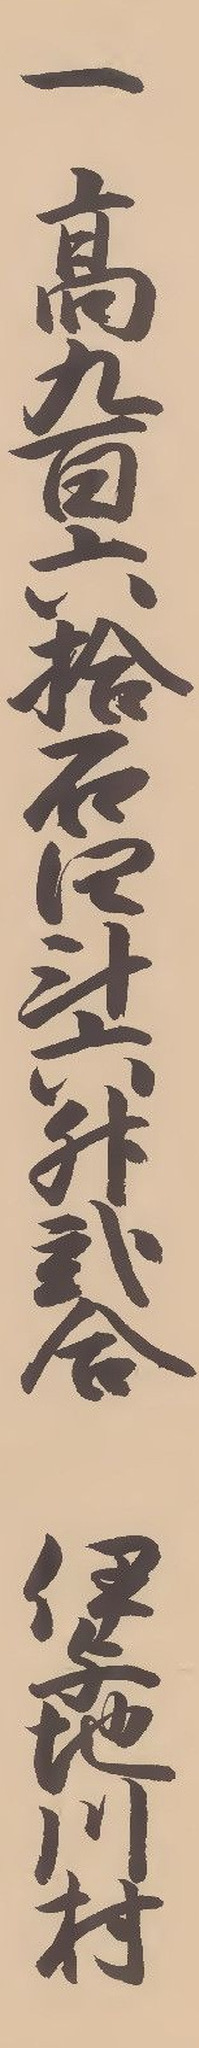一高九百六拾石四斗六升弐合伊与地川村
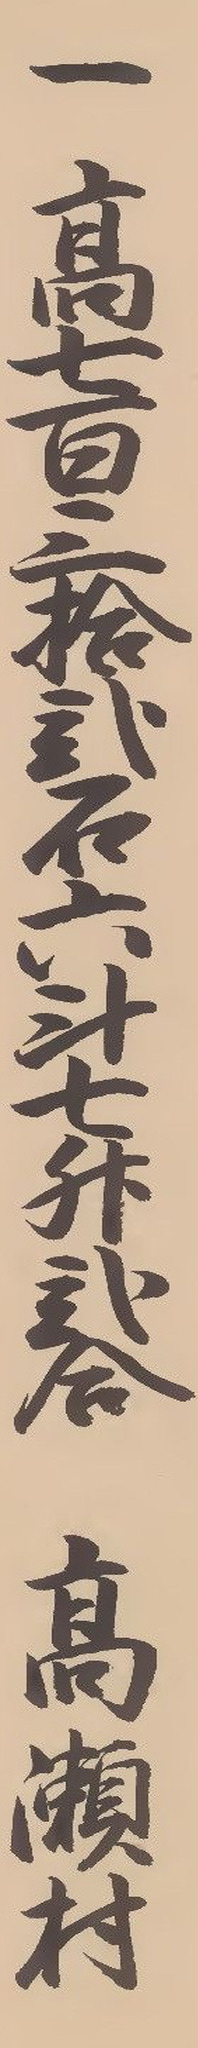一高七百三拾弐石六斗七升弐合高瀬村
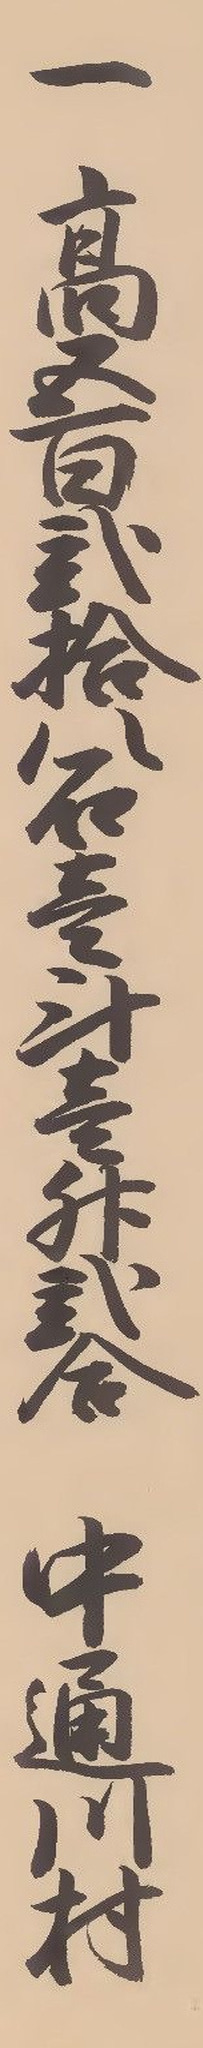一高五百弐拾八石壱斗壱升弐合中通川村
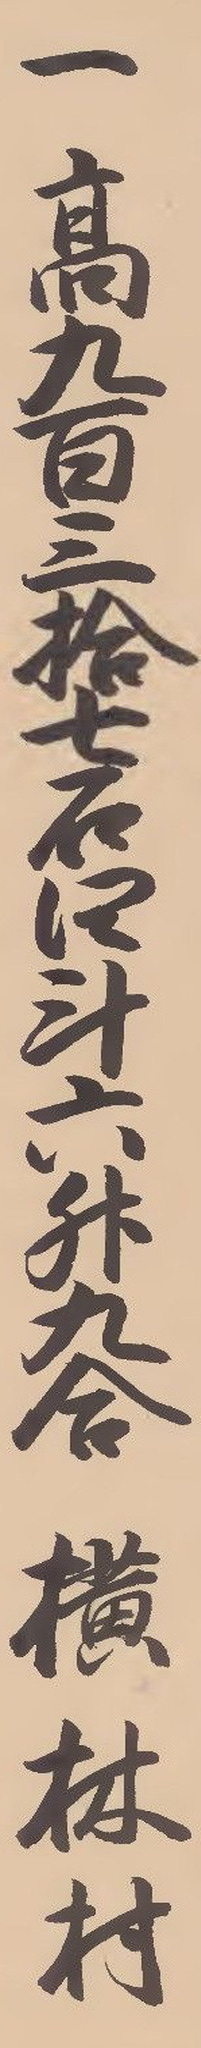一高九百三拾七石四斗六升九合横林村
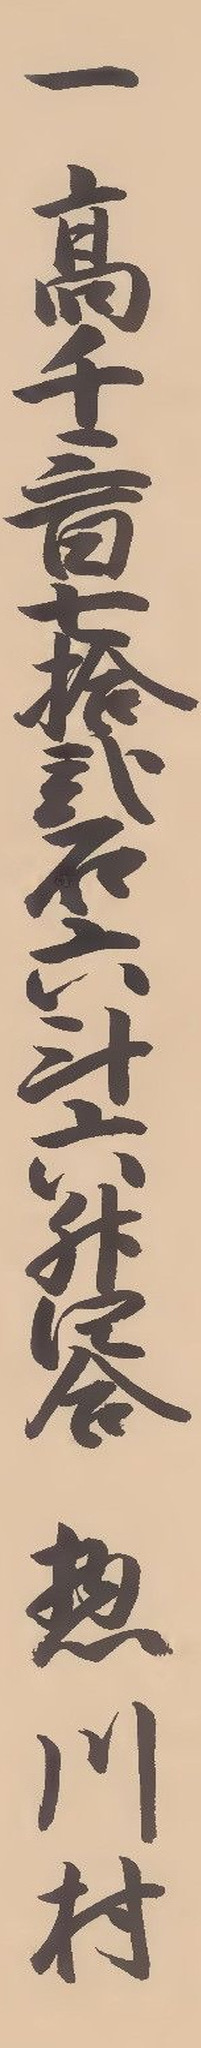一高千三百七拾弐石六斗六升四合惣川村
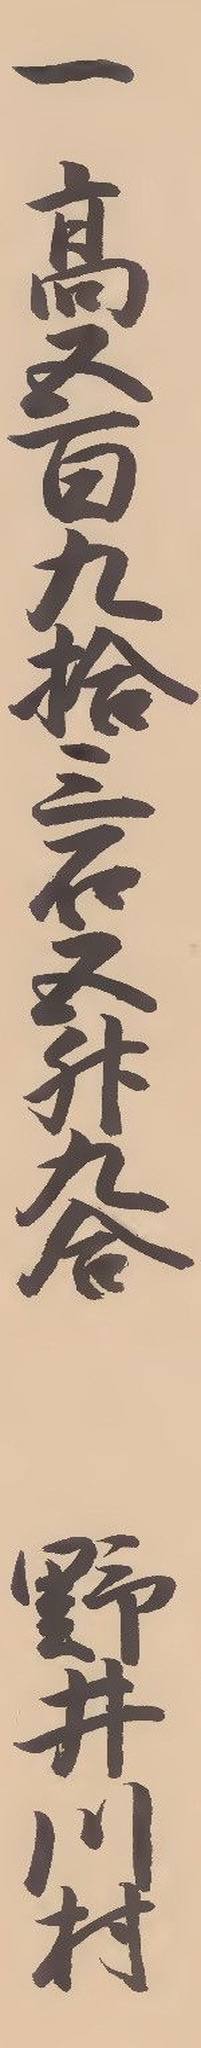一高五百九拾三石五升九合野井川村
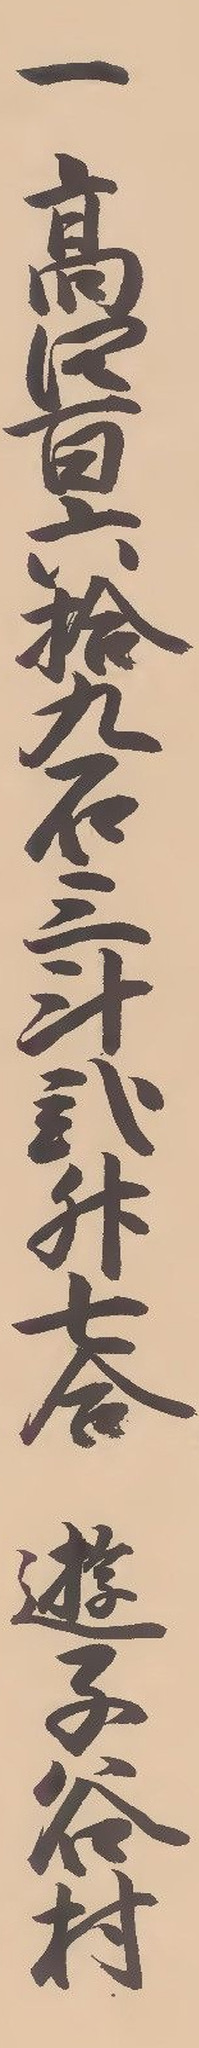一高四百六拾九石三斗弐升七合遊子谷村

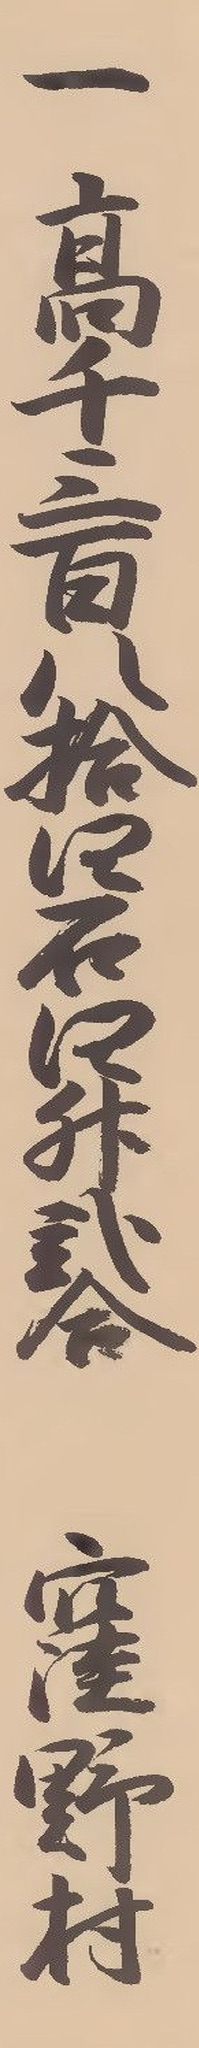一高千三百八拾四石四升弐合窪野村
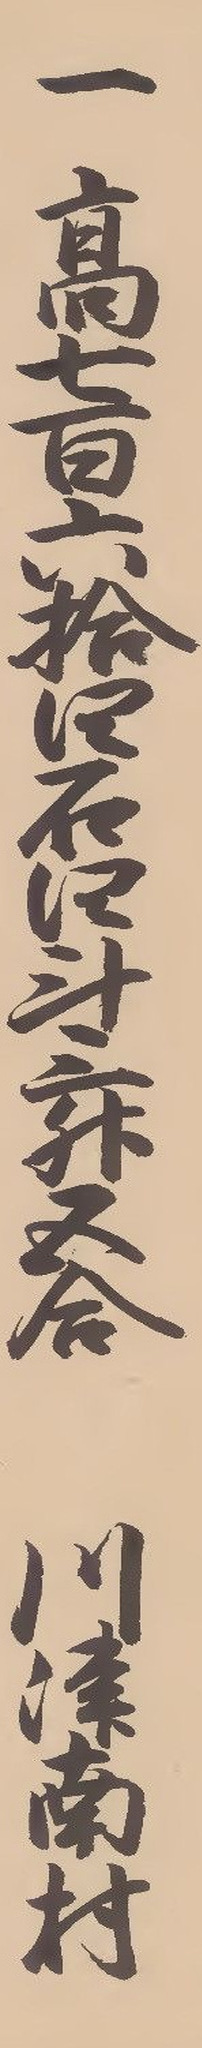一高七百六拾四石四斗三升五合川津南村
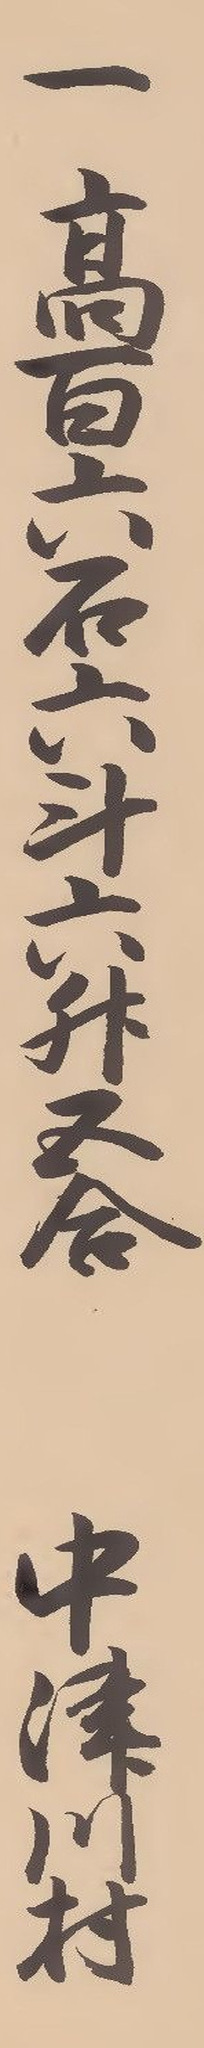一高百六石六斗六升五合中津川村
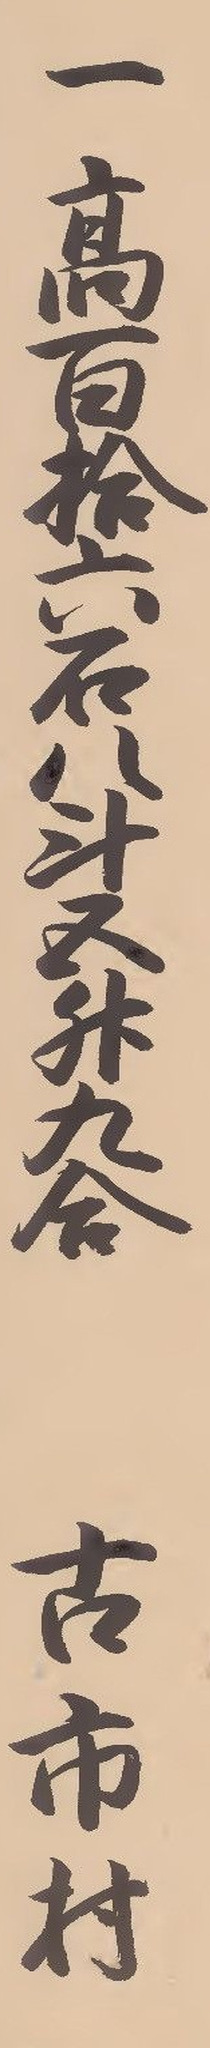一高百拾六石八斗五升九合古市村
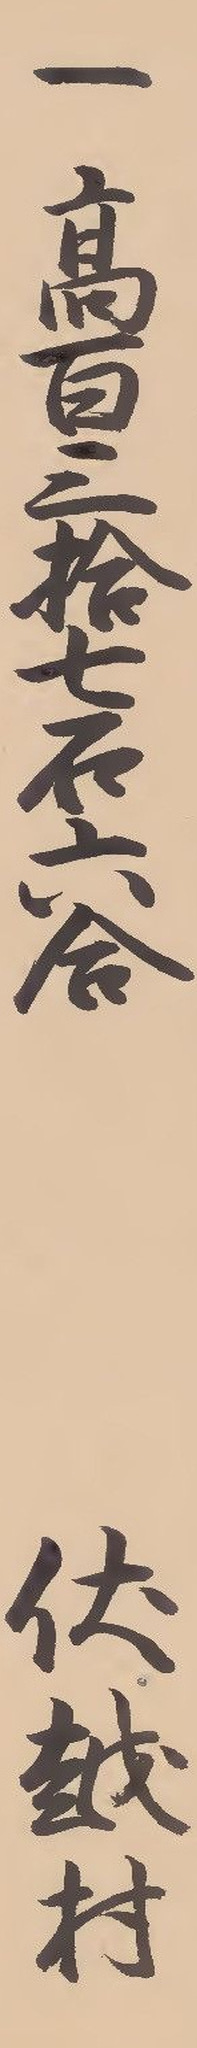一高百三拾七石六合伏越村
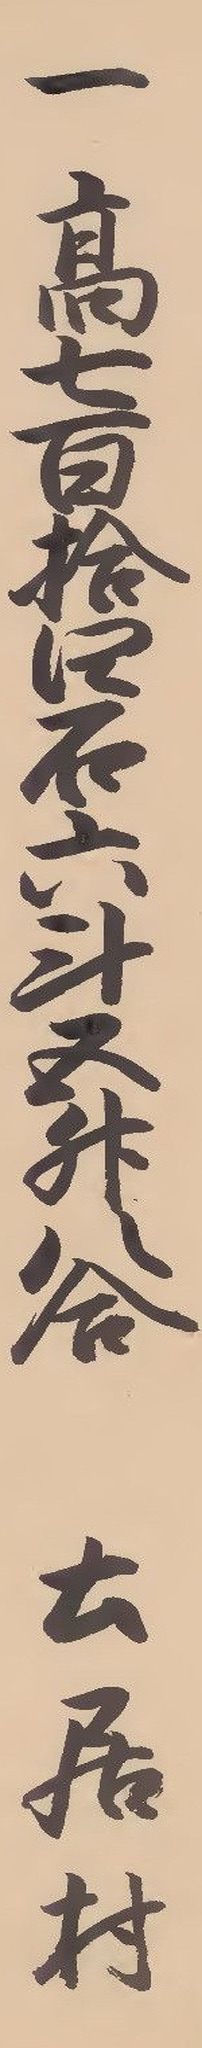一高七百拾四石六斗五升八合土居村
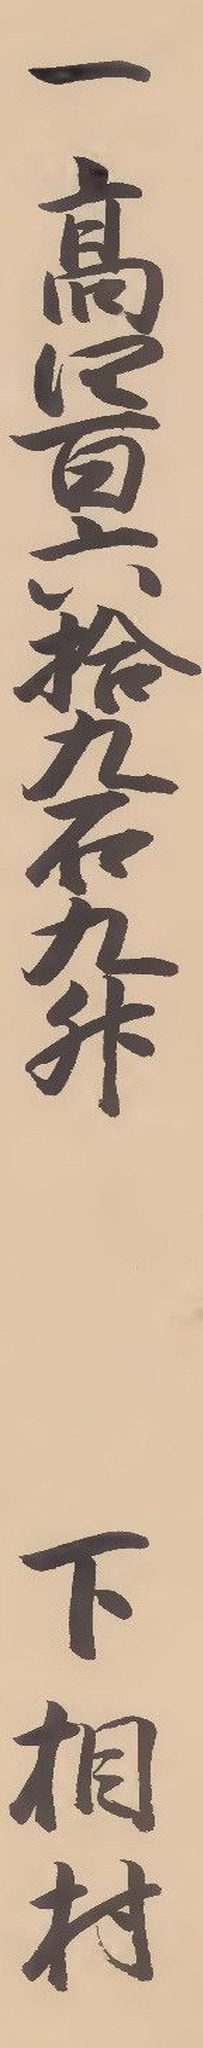一高四百六拾九石九升下相村
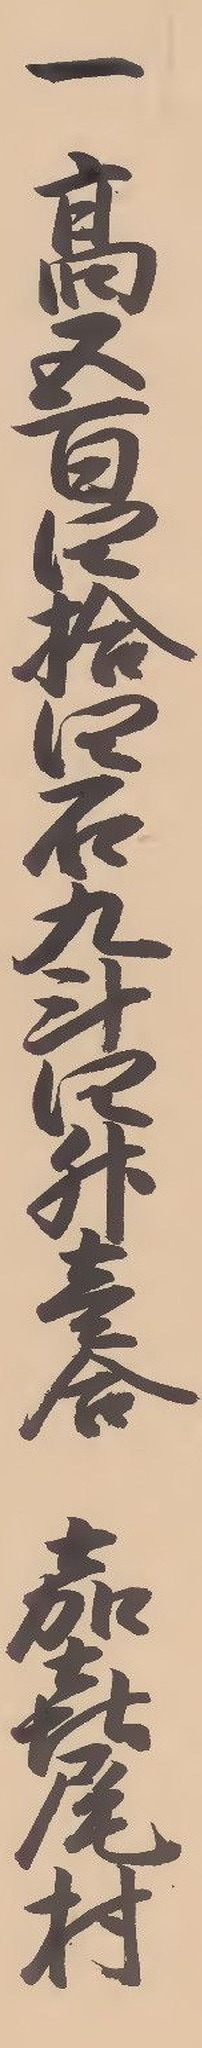一高五百四拾四石九斗四升壱合嘉喜尾村
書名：伊予国郷帳
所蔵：国立公文書館 National Archives of Japan
